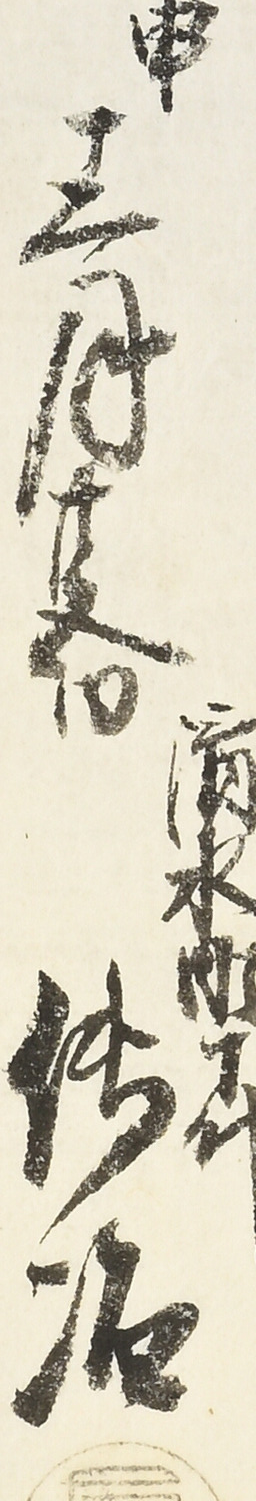十二月廿五日傳治
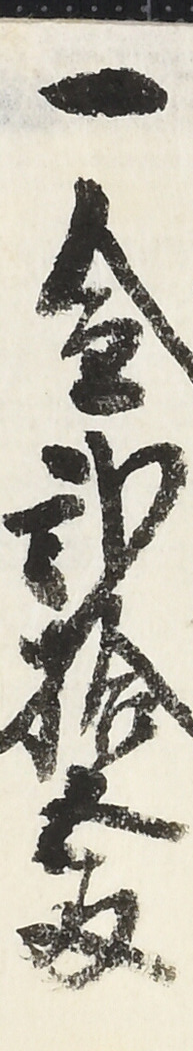一金弐拾五両
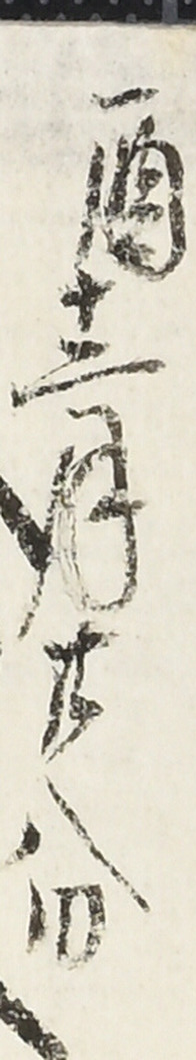酉十二月廿八日
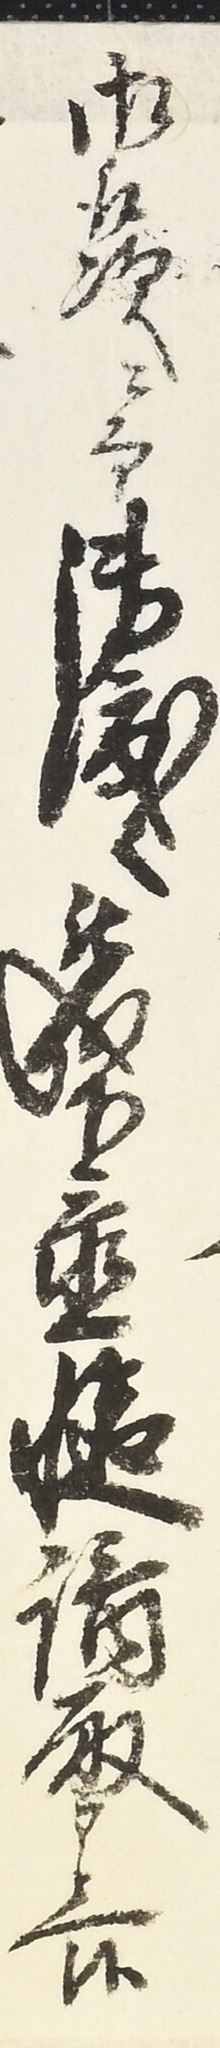御取次ニ而御渡し被成下置慥請取申上候
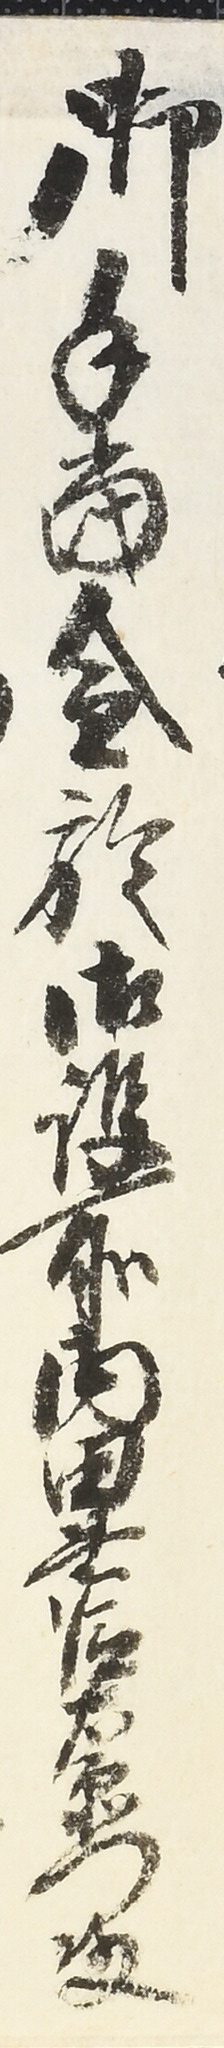御手当金於御役所内田菅右衛門殿
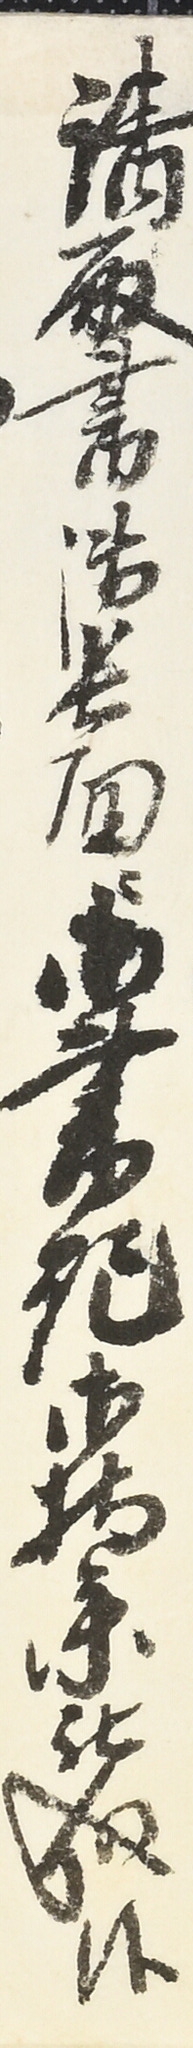請取書御帳面ニ御書記御持参被成候
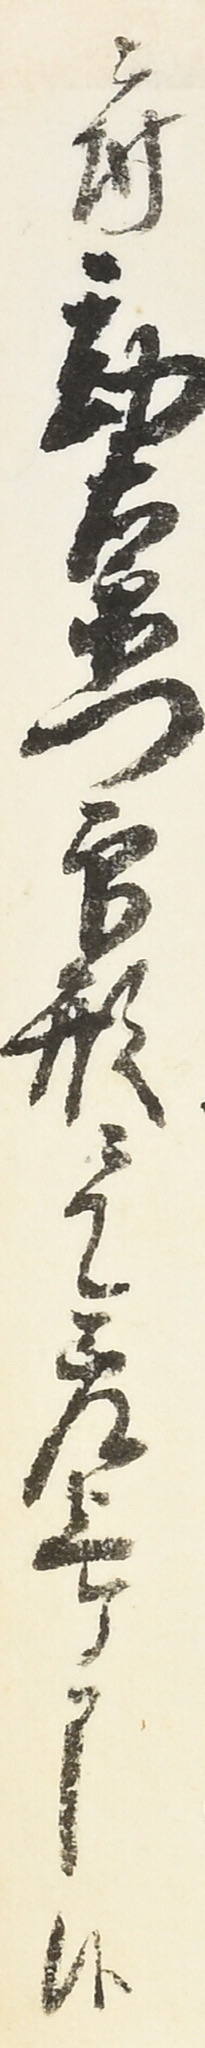ニ付勘右衛門印形ニ而差上ケ申候

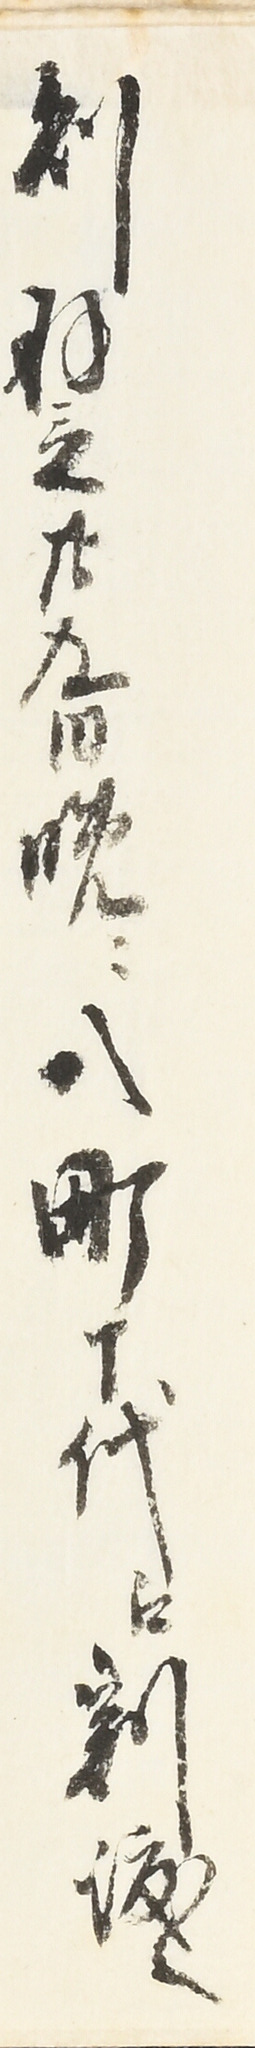則翌廿九日晩ニ八町丁代江割渡し
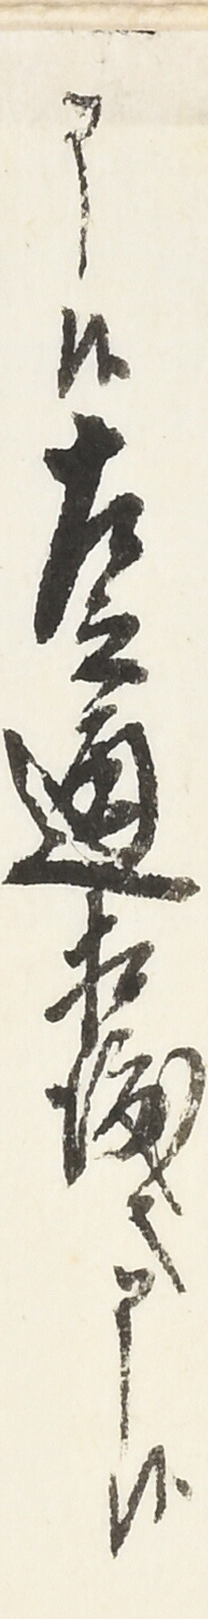申候左之通相渡し申候
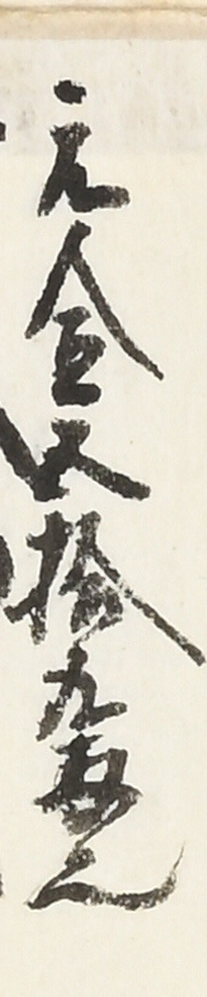元金五拾九両也
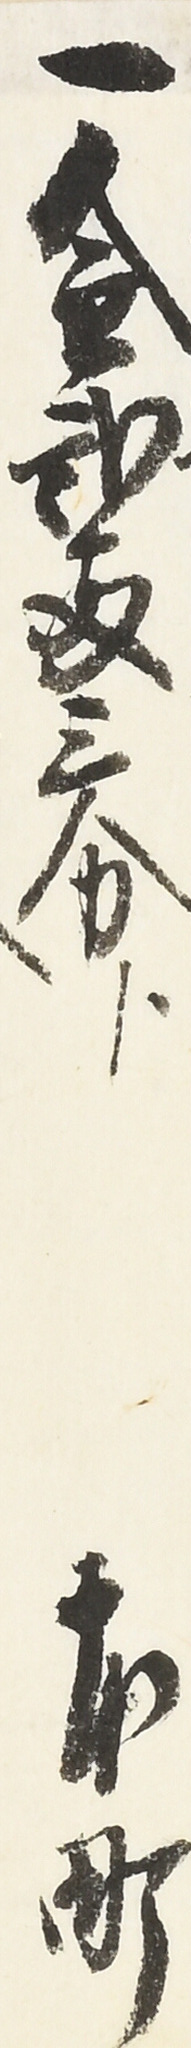一金弐両三分ト本町
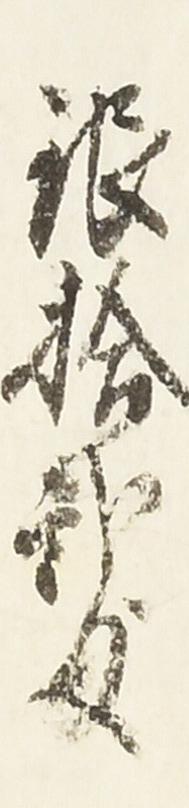銀拾弐匁
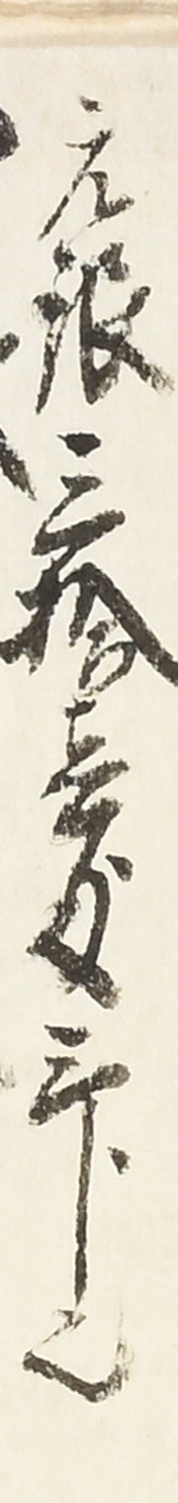元銀三拾壱匁三分也
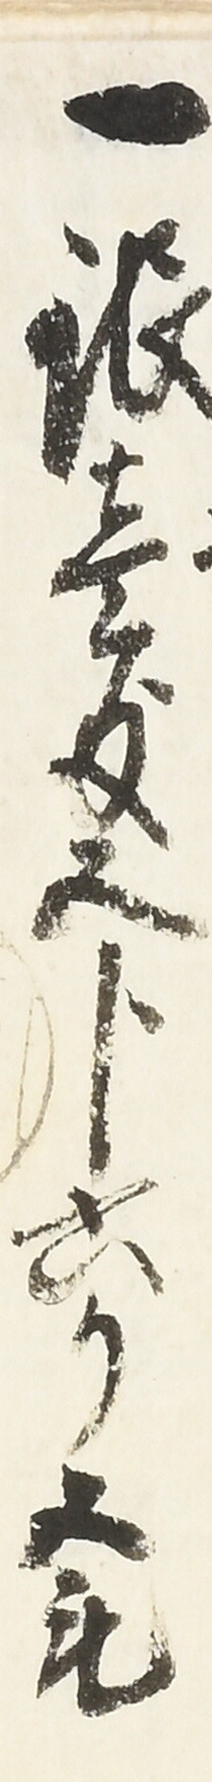一銀壱匁五分六厘五毛
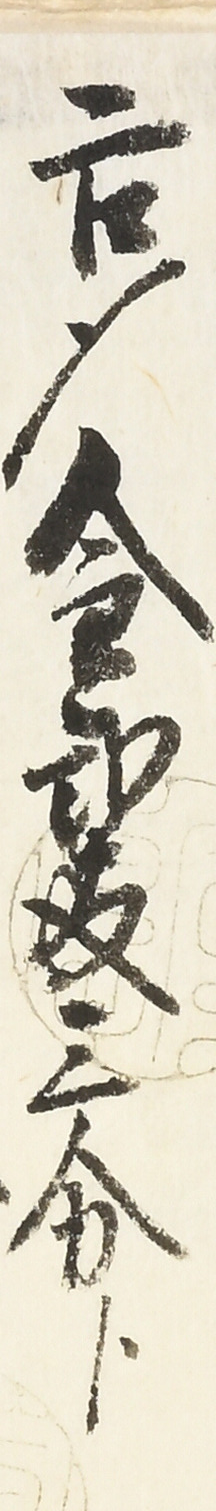二口〆金弐両三分ト
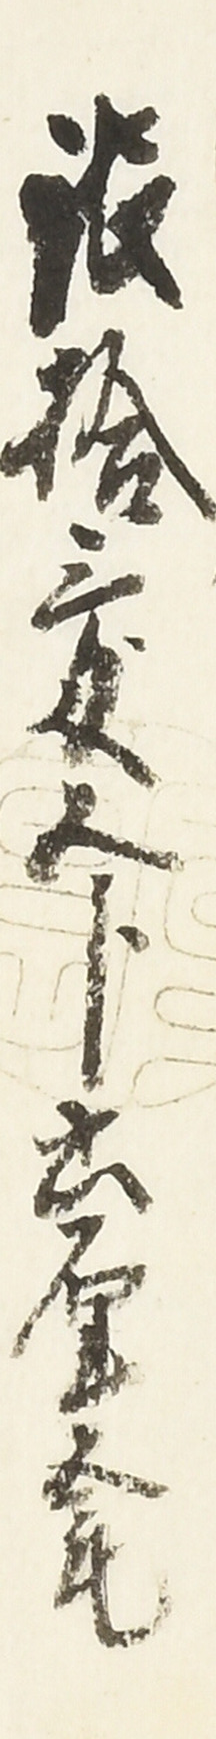銀拾三匁五分六厘五毛
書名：御才覚金御利足割渡扣帳
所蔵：伊那市立高遠町図書館・合同会社AMANE
